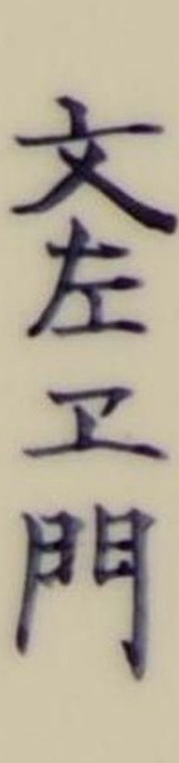文左ヱ門
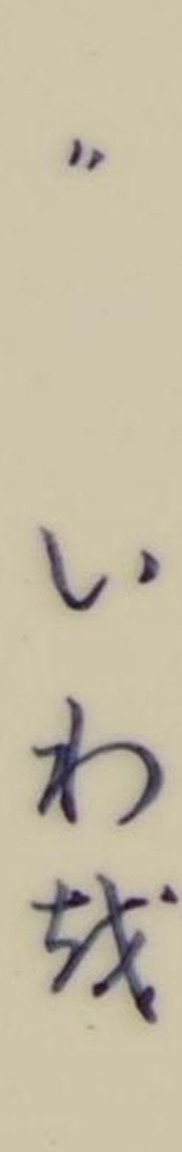いわを

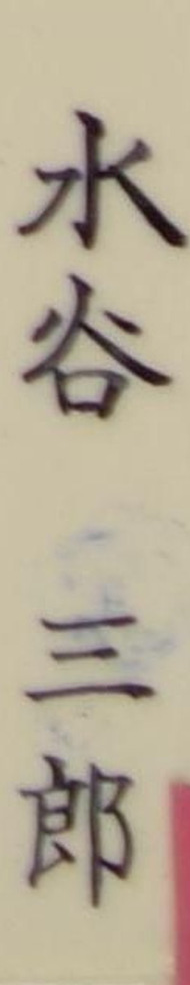水谷三郎
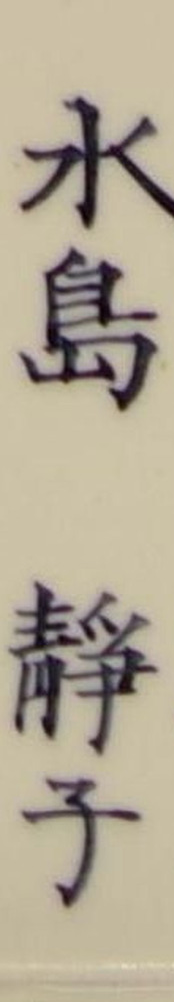水島静子
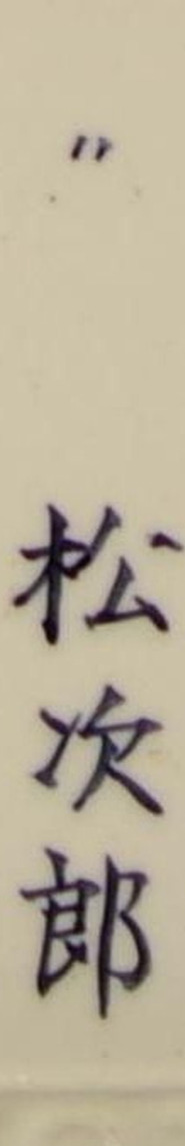松次郎
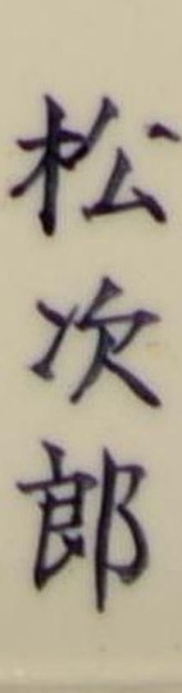松次郎
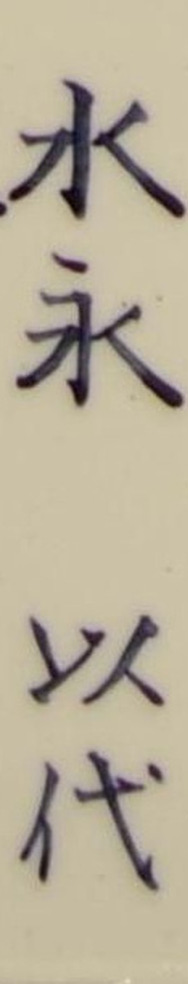水永以代
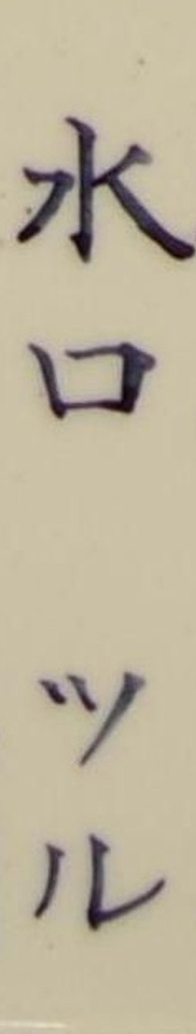水口ツル
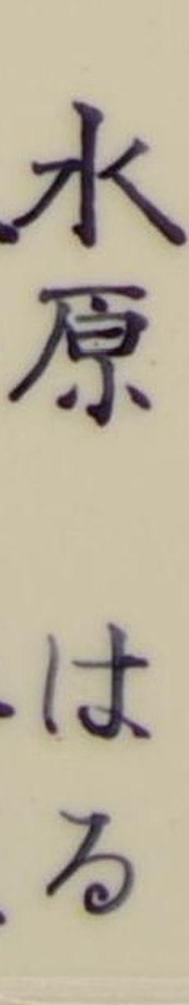水原はる
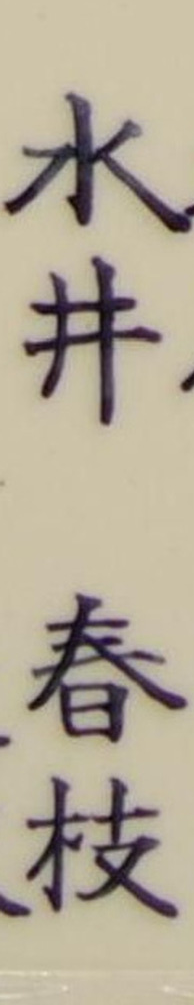水井春枝
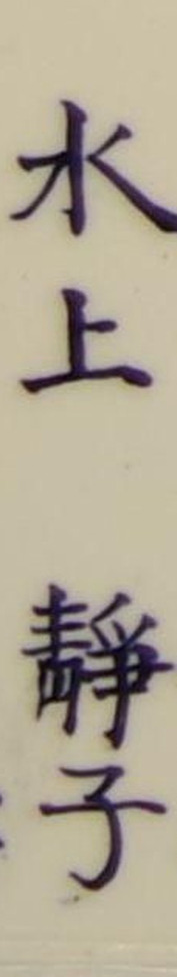水上静子
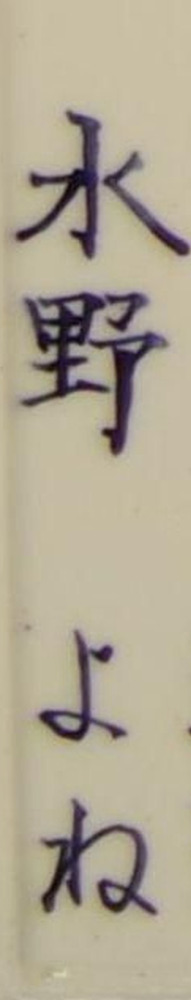水野よね

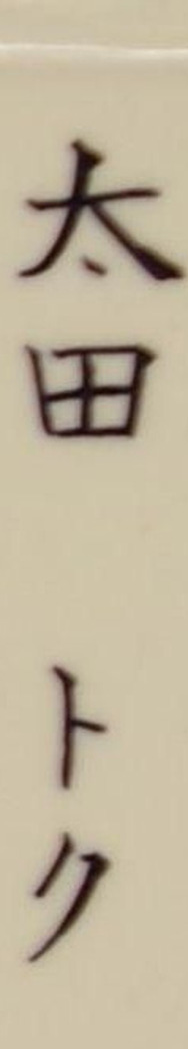太田トク
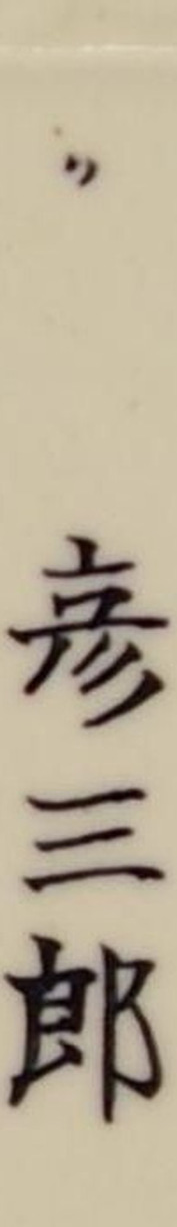彦三郎
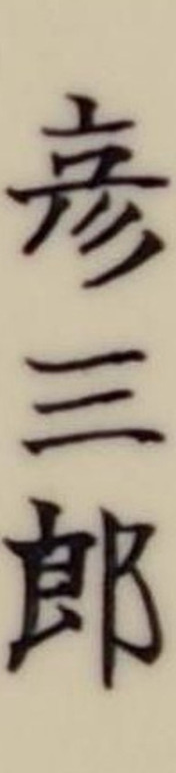彦三郎
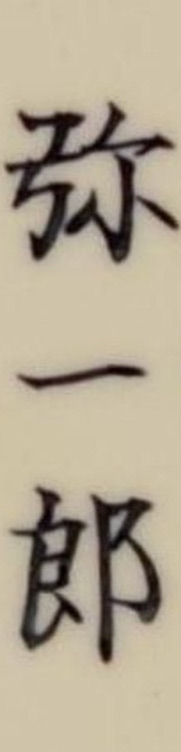弥一郎
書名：E~L
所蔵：高野山金剛峯寺
